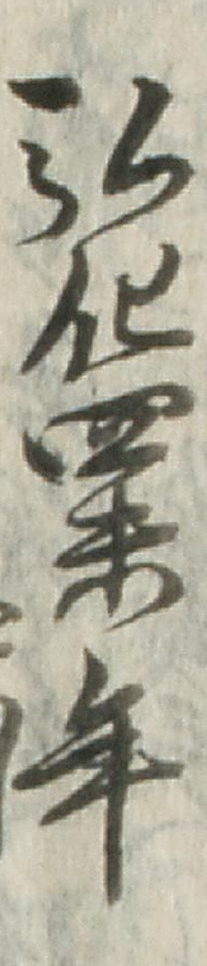弘化四未年
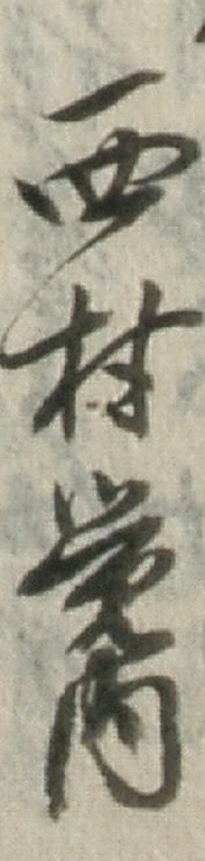西村覚内
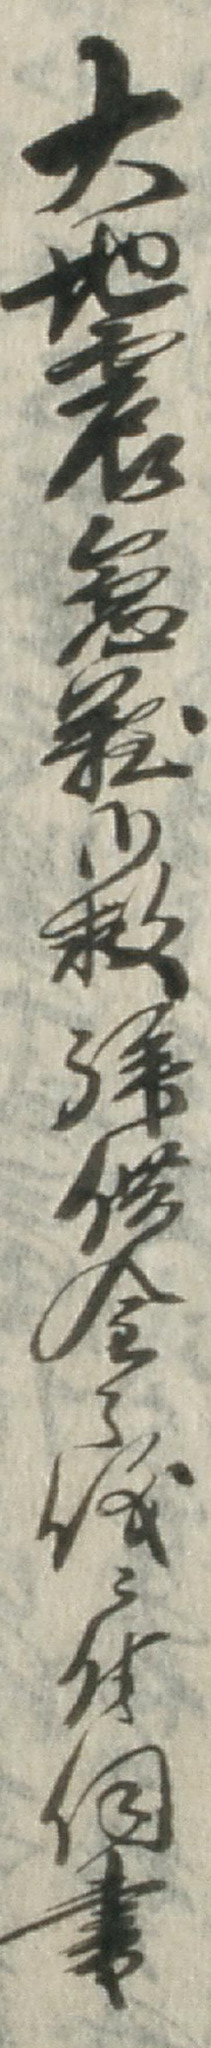大地震急難御救拝借金之儀二付伺書
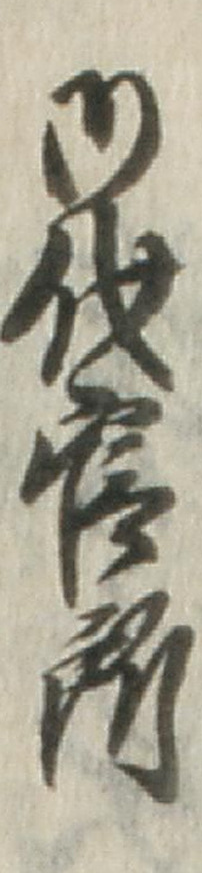御代官所
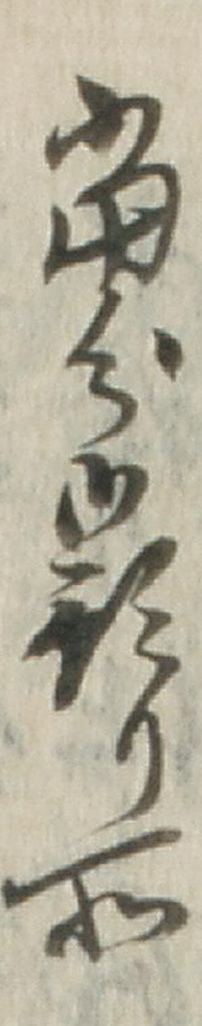当分御預り所
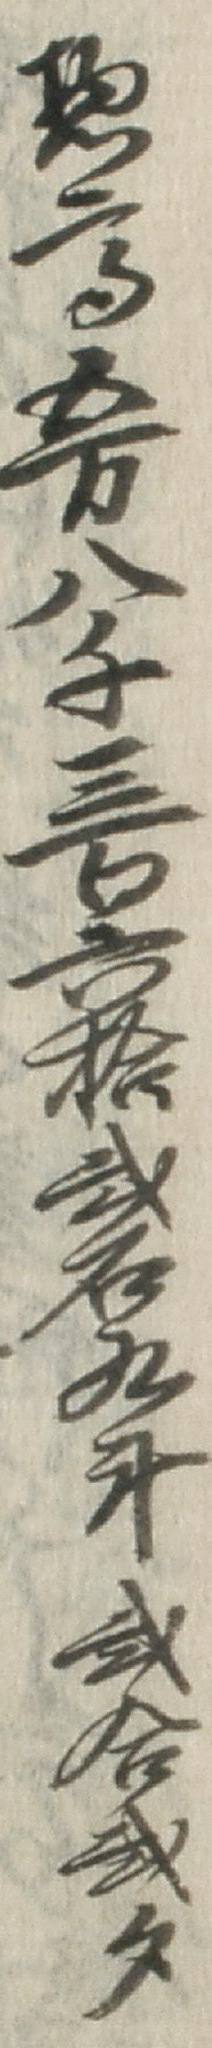惣高五万八千三百六拾弐石九斗弐合弐勺
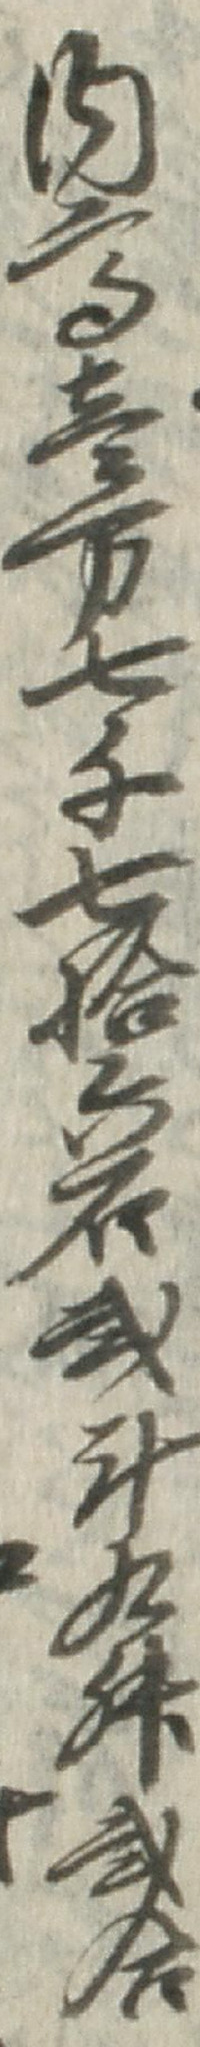内高壱万七千七拾六石弐斗九升弐合
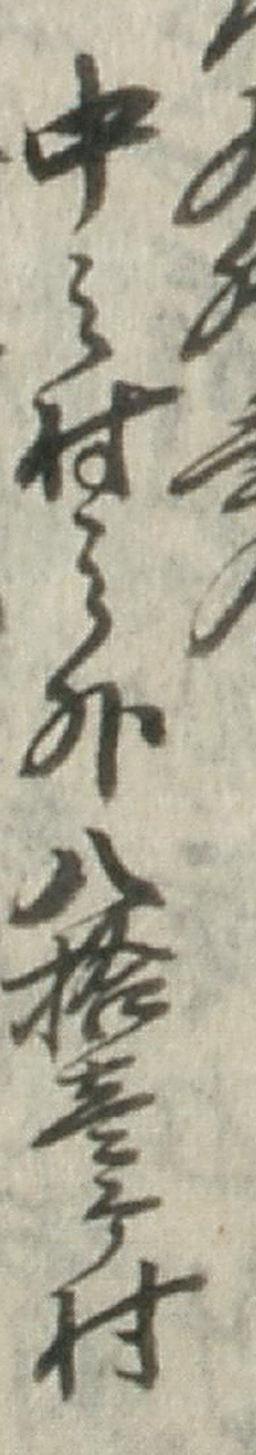中野村之外八拾壱ヶ村
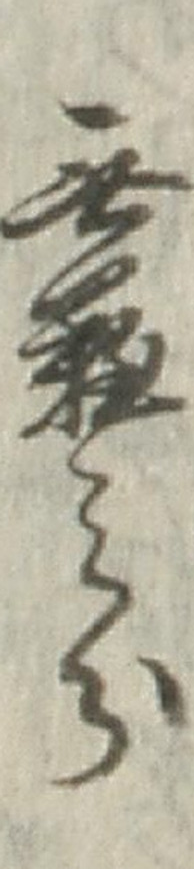無難之分
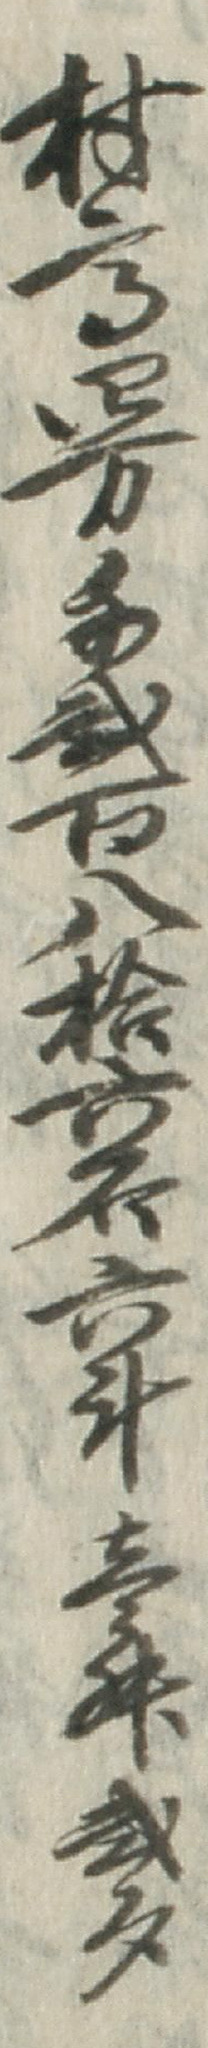村高四万千弐百八拾六石六斗壱升弐勺
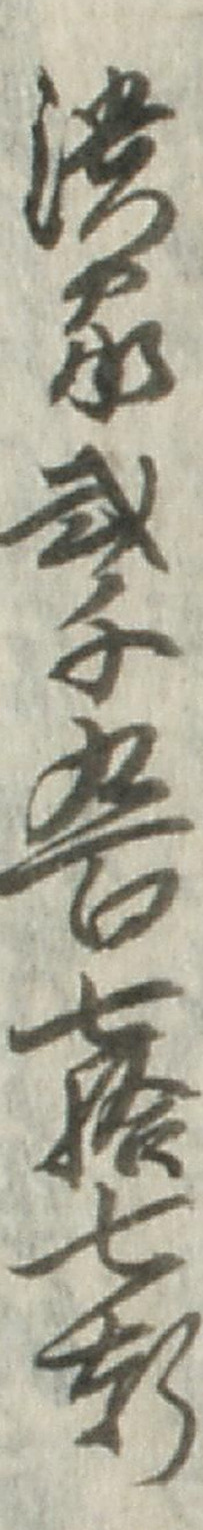潰家弐千五百七拾七軒
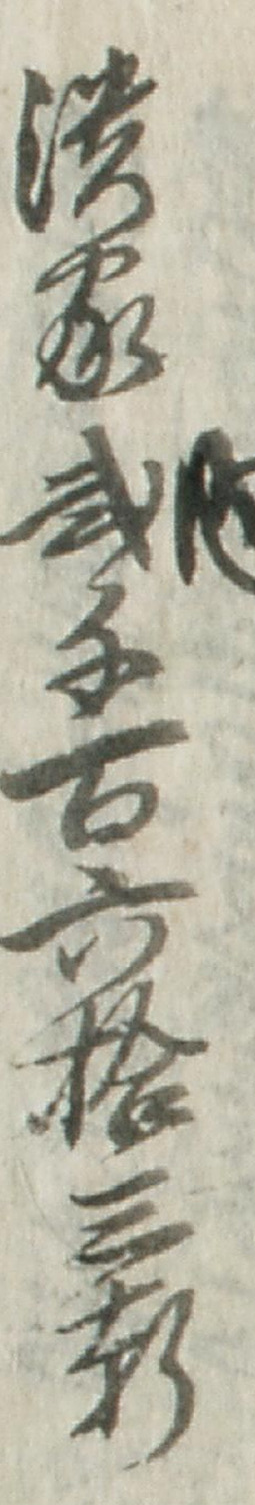潰家弐千百六拾三軒
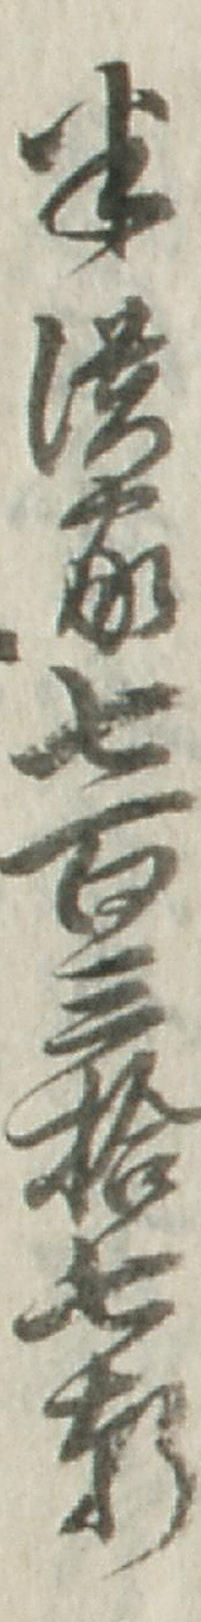半潰家七百三拾七軒

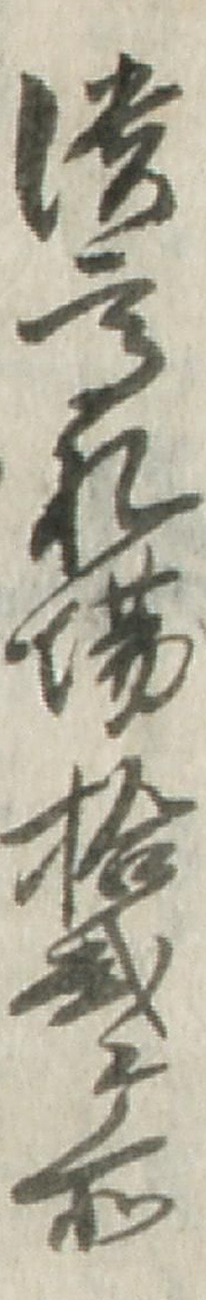潰高札場拾弐ヶ所
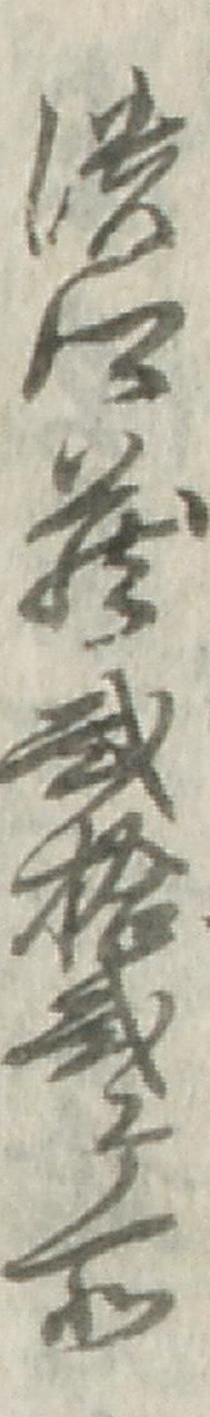潰郷蔵弐拾弐ヶ所
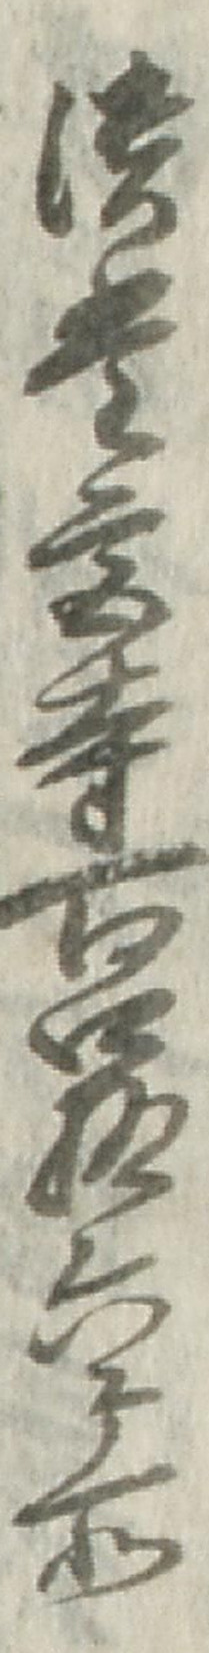潰堂宮寺百四拾六ヶ所
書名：信濃國地震實録記
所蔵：東京大学地震研究所図書室 Earthquake Research Institute Library, The University of Tokyo, JAPAN
